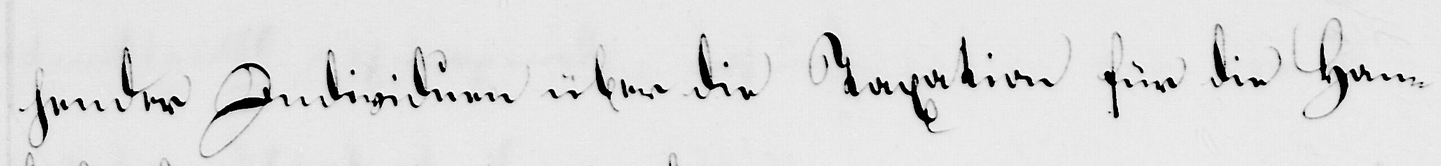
hender Individuen über die Taxation für die Han¬
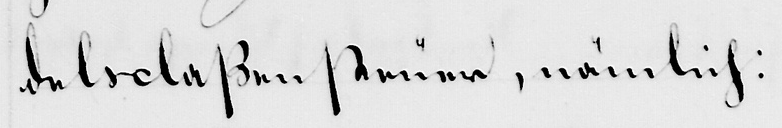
delsclaßensteuer, nämlich:
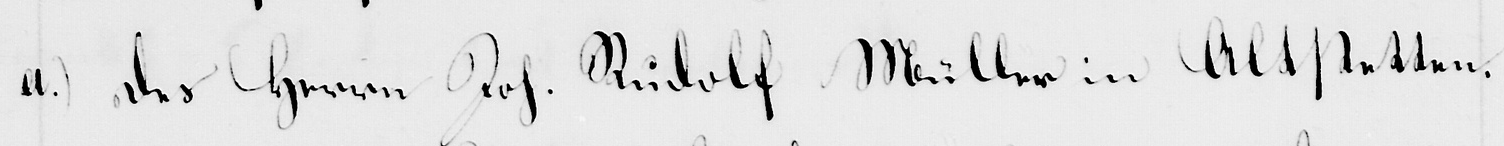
a.) des Herrn Joh. Rudolf Müller in Altstetten.
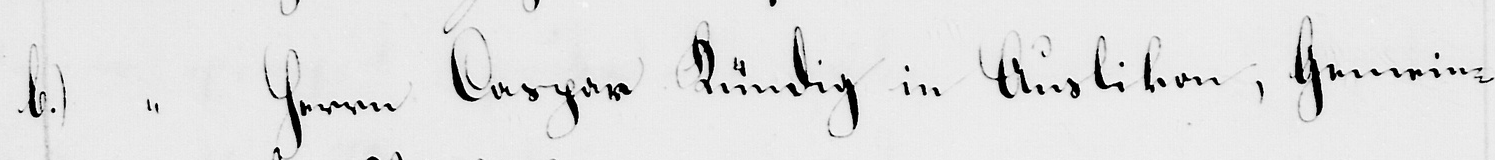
b.) " Herrn Caspar Kündig in Auslikon, Gemein¬
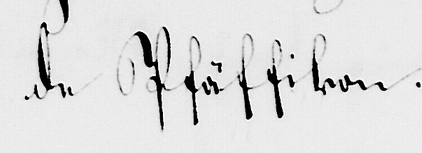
de Pfäffikon.
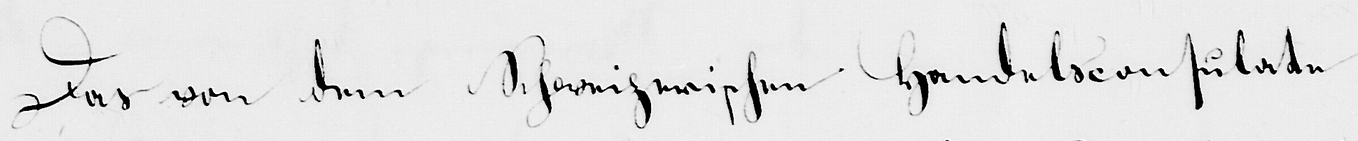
Das von dem Schweizerischen Handelsconsulate
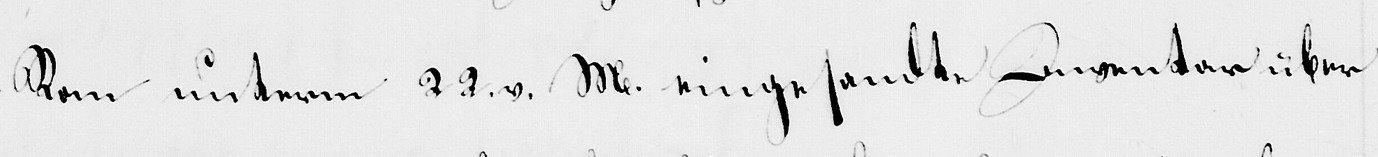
Rom unterm 22. v. M. eingesandte Inventar über
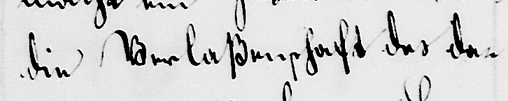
die Verlassenschaft des da¬
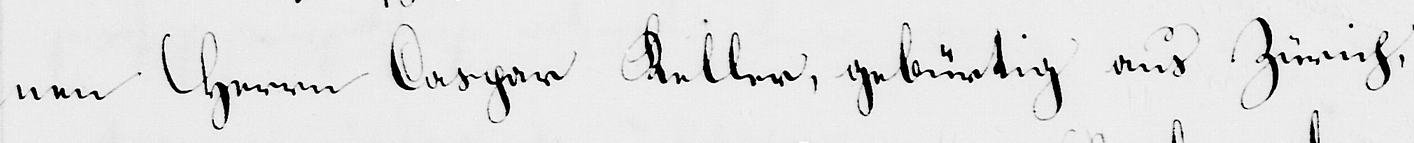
nen Herrn Caspar Keller, gebürtig aus Zürich,
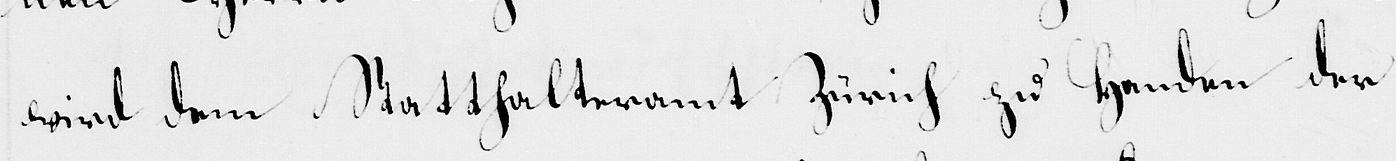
wird dem Statthalteramt Zürich zu Handen der
